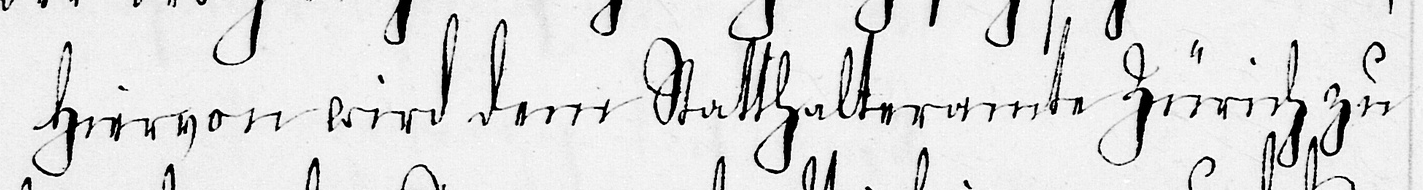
Hiervon wird dem Statthalteramte Zürich zu
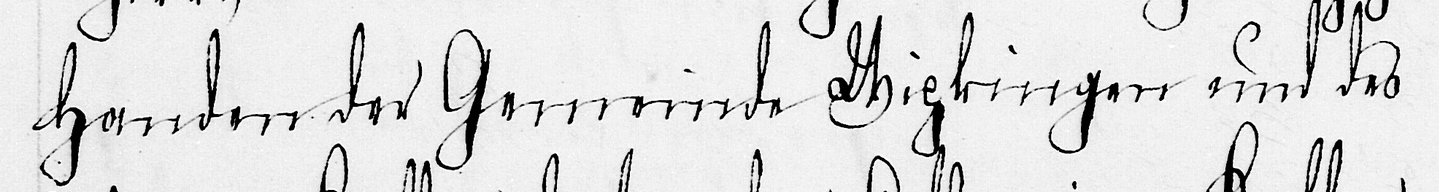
Handen der Gemeinde Wipkingen und des
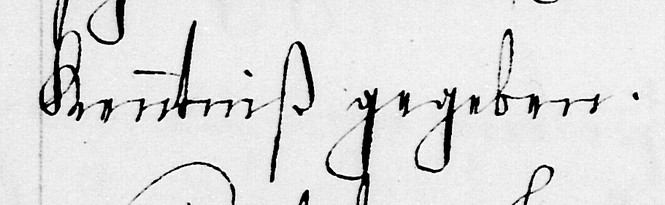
Kenntniß gegeben.
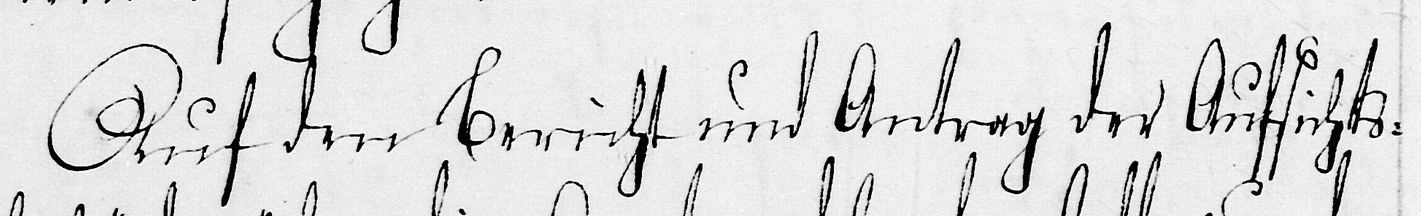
Auf den Bericht und Antrag der Aufsicht¬
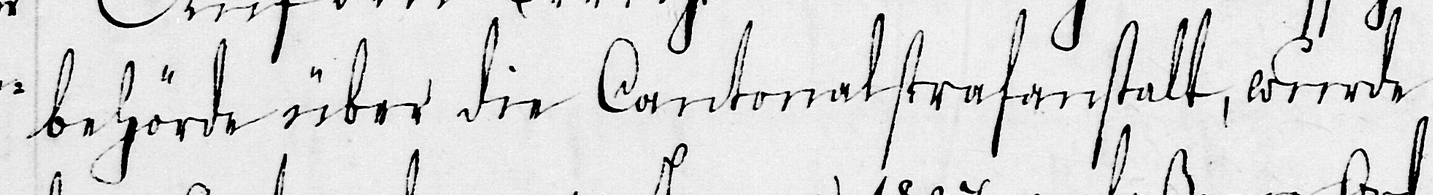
sbehörde über die Cantonalstrafanstalt, wurde
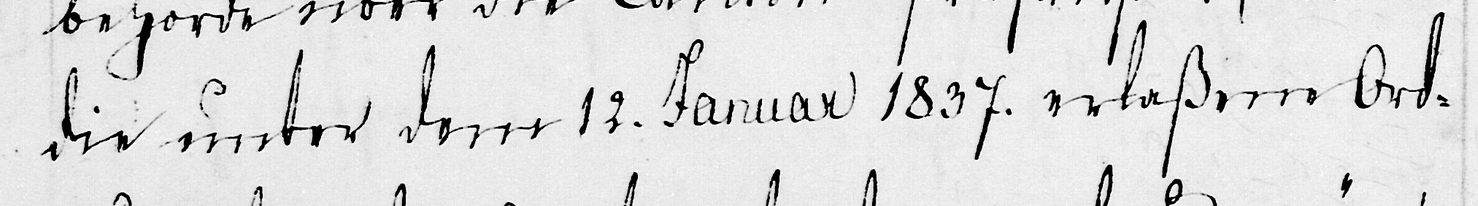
die unter dem 12. Januar 1837. erlaßene Ord¬
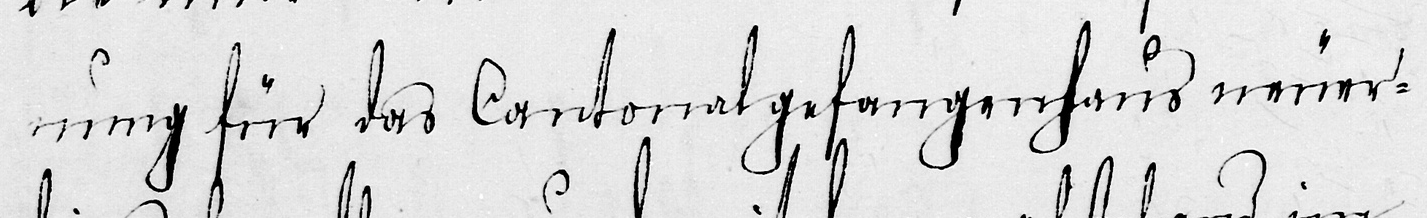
nung für das Cantonalgefangenhaus neuer¬
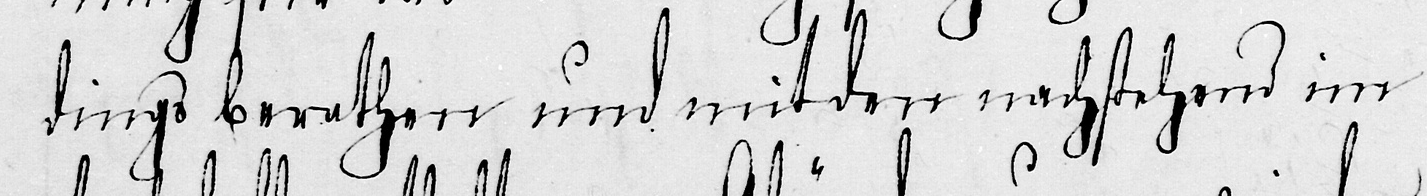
dings berathen und mit den nachstehend im
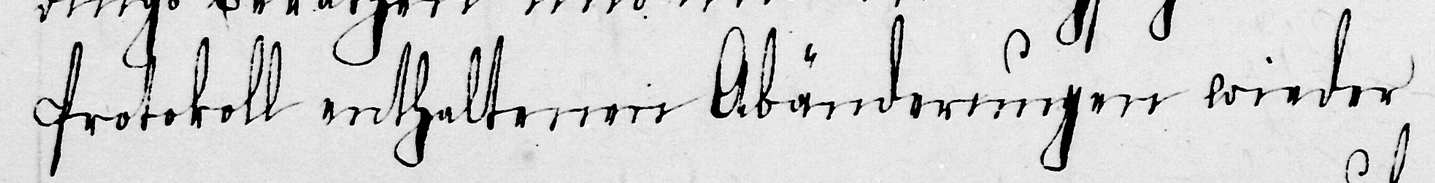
Protokoll enthaltenen Abänderungen wieder
